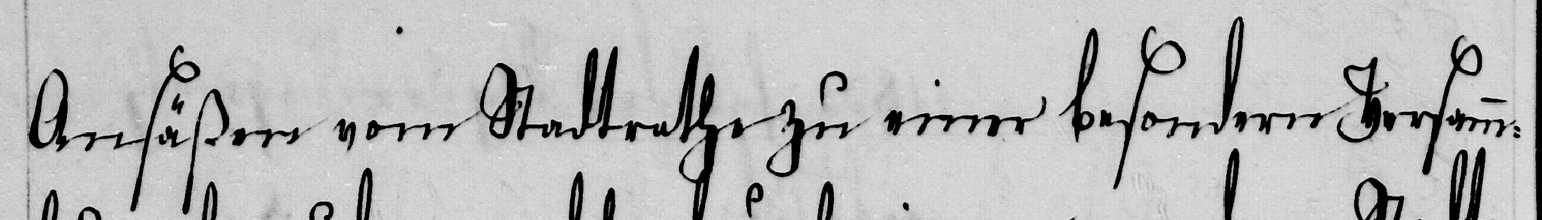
Ansäßen vom Stadtrathe zur einer besondern Versam¬
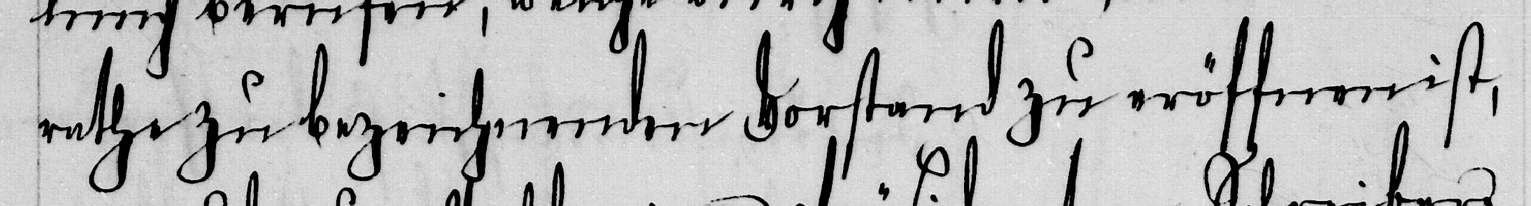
rathe zu bezeichnenden Vorstand zu eröffnen ist,
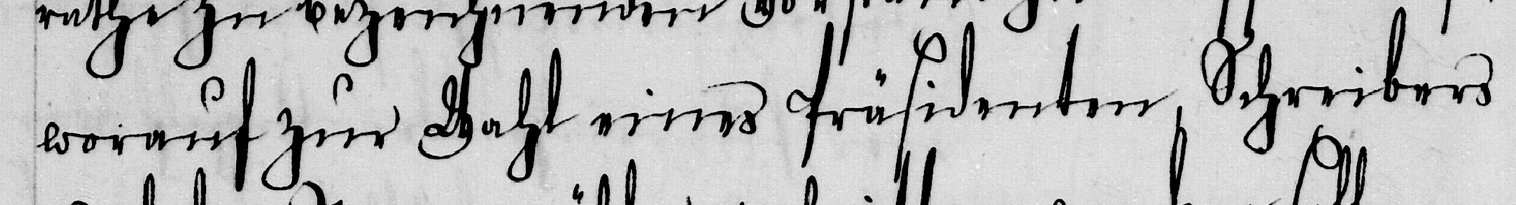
worauf zur Wahl eines Präsidenten, Schreibers
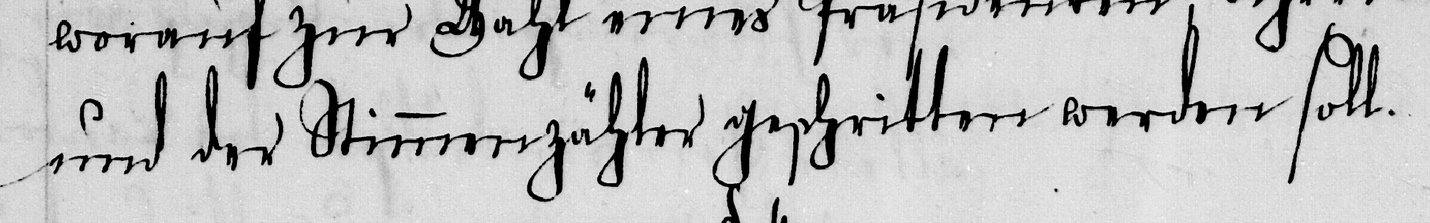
und der Stimmzähler geschritten werden soll.
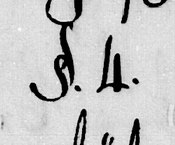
§. 4.
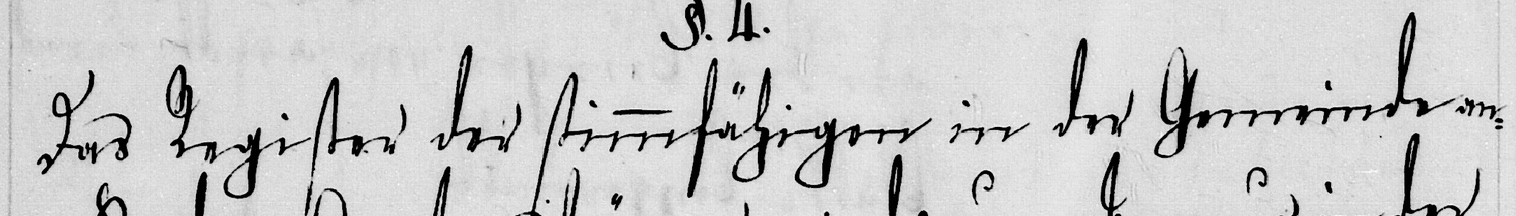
Das Register der stimmfähigen in der Gemeinde an¬
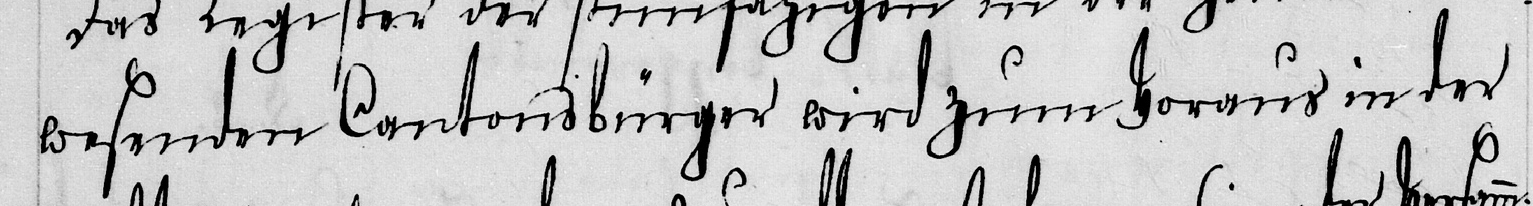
wesenden Cantonsbürger wird zum Voraus in der
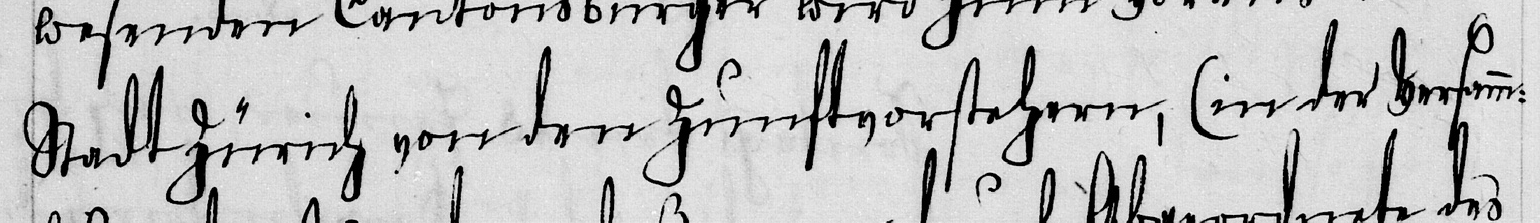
Stadt Zürich von den Zunftvorstehern, (in der Versam¬
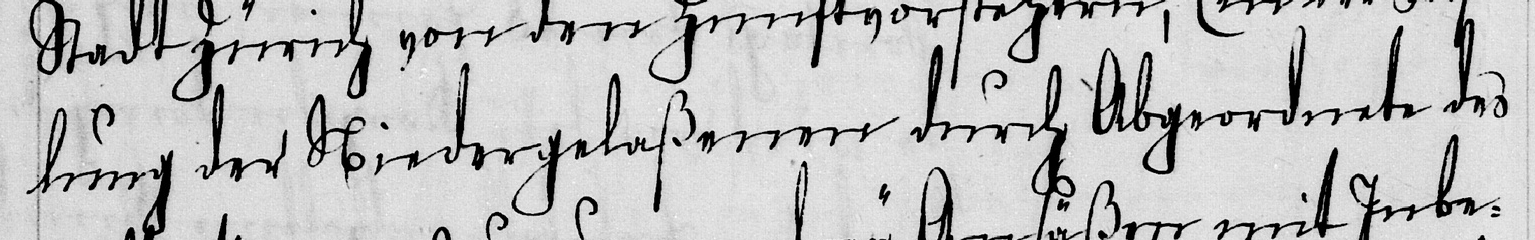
mlung der Niedergelaßenen durch Abgeordnete des
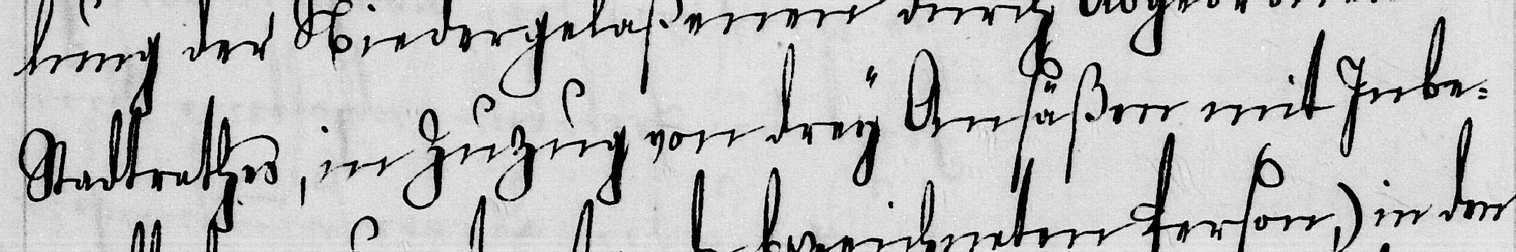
Stadtrathes, in Zuzug von drey Ansäßen mit Inbe¬
